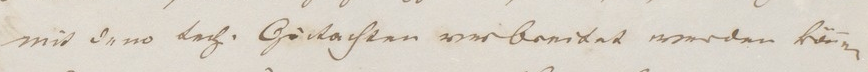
mit dem tech. Gutachten verbreitet werden können,
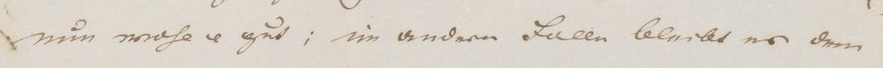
nun wohl & gut; im andern Falle bleibt es dem
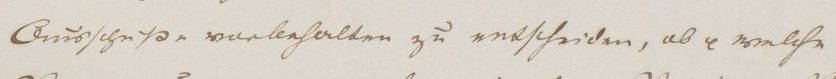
Ausschuße vorbehalten zu entscheiden, ob & welche
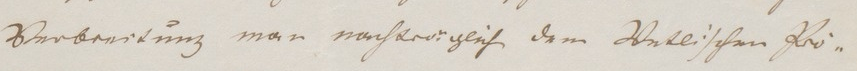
Verbreitung man nachträglich dem Wetli'schen Pro-
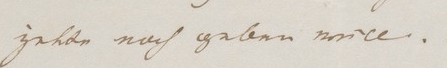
jekte noch geben will. –
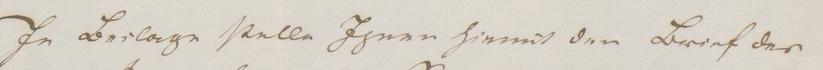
In Beilage stelle Ihnen hiemit den Brief des
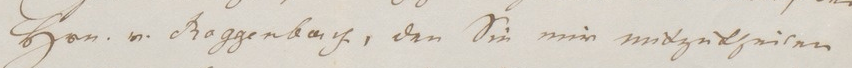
Hrn. v. Roggenbach, den Sie mir mitzutheilen
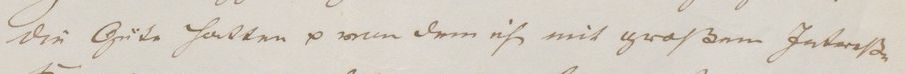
die Güte hatten & von dem ich mit großem Intereße
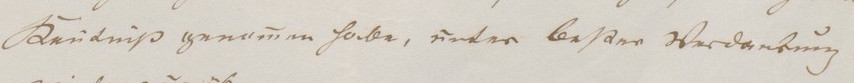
Kenntniß genommen habe, unter bester Verdankung
